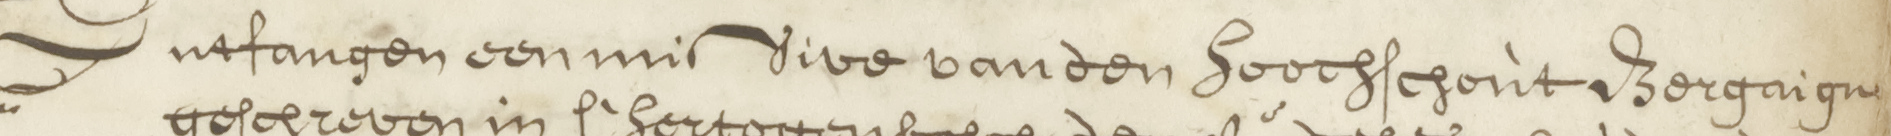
Ontfangen een missive van den Hoochschout Bergaigne
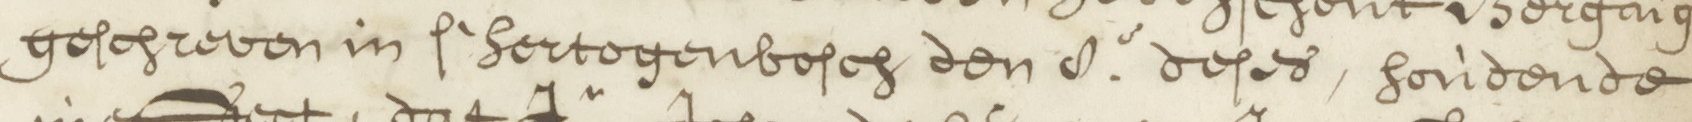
geschreven in s'hertogenbosch den 8e. deses, houdende
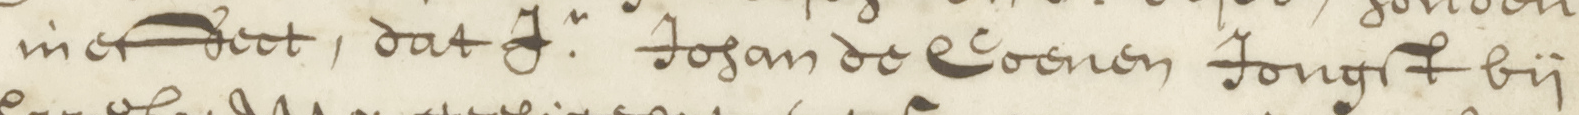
in effect, dat Jr. Johan de Coenen Jongst bij
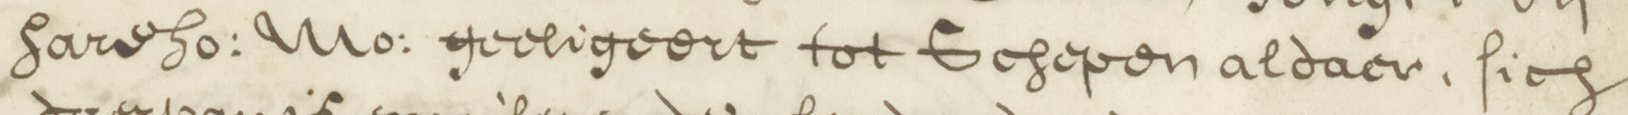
hare ho:Mo: geeligeert tot Schepen aldaer, sich
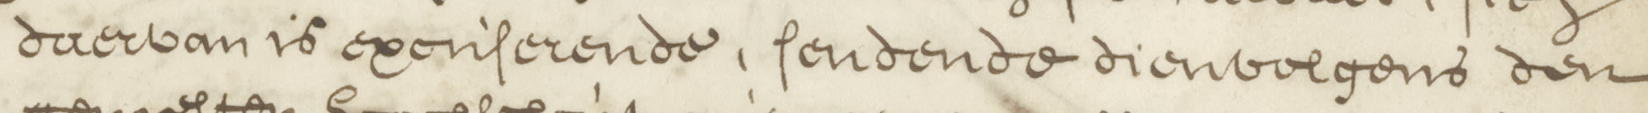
daervan is excuserende, sendende dienvolgens den
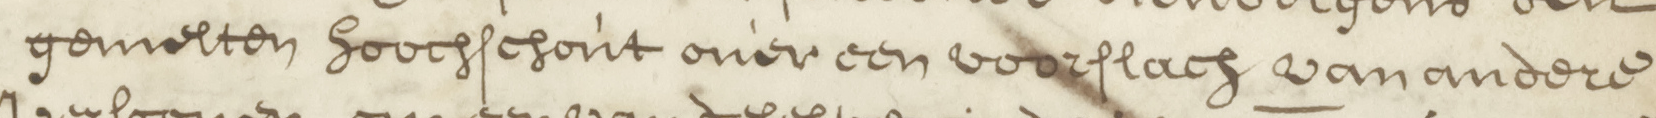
gemelten hoochschout ouer een voorslach van andere
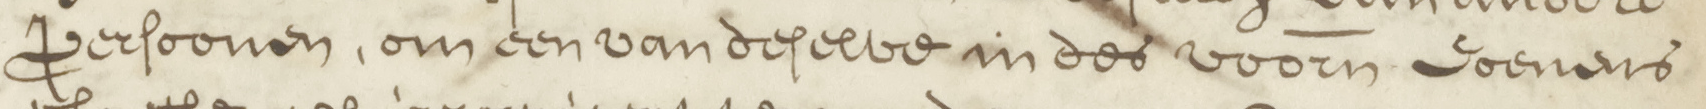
Persoonen, om een van deselve in des voorn Coenens
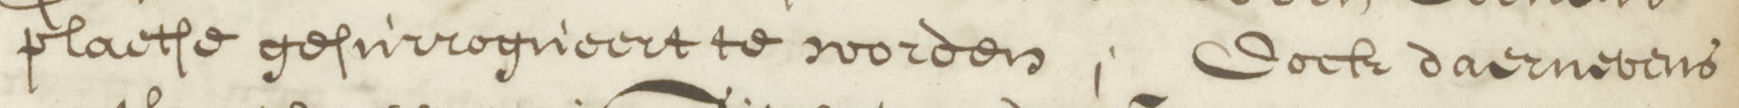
plaetse gesurrogueert te worden; Oock daernevens
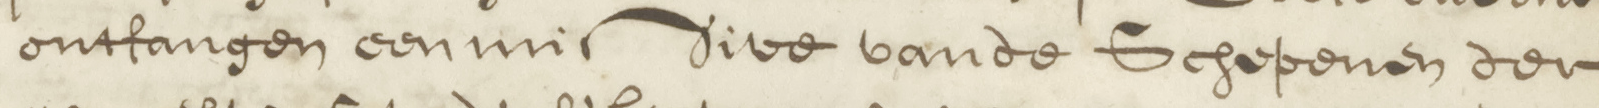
ontfangen een missive van de Schepenen der
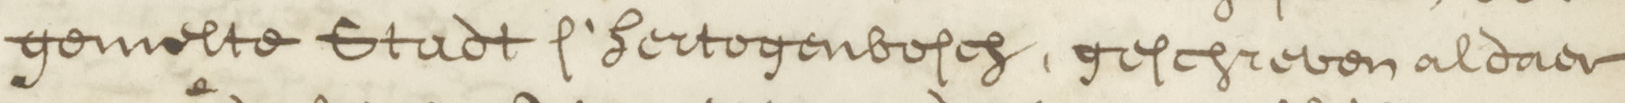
gemelte Stadt s'hertogenbosch, geschreven aldaer
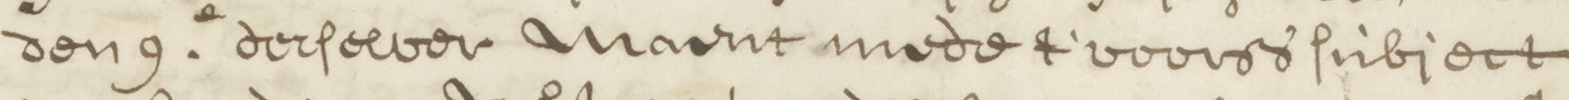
den 9e. derselver Maent mede t' voorsz subject
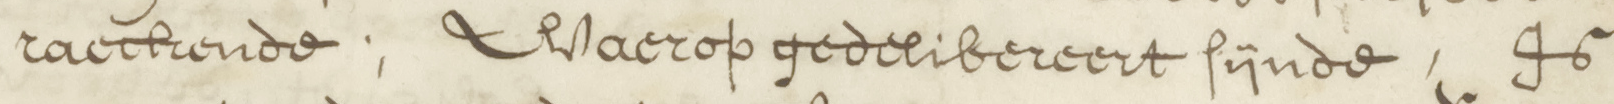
raeckende; Waerop gedelibereert sijnde, Is
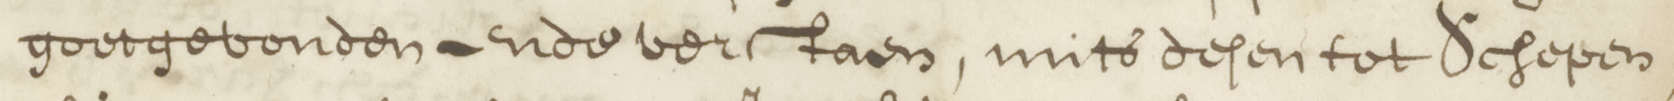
goetgevonden ende verstaen, mits desen tot Schepen
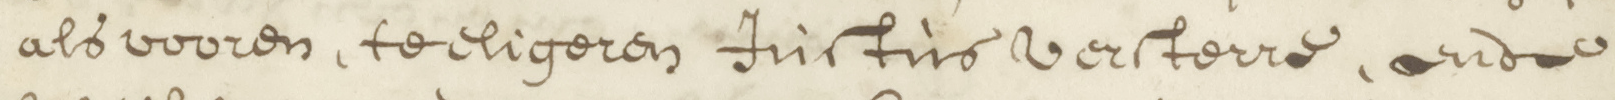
als vooren, te eligeren Justus versterre, ende
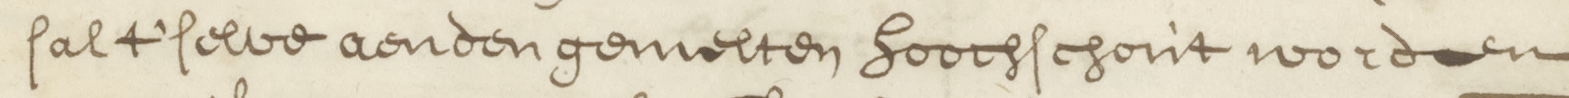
sal t'selve aen den gemelten Hoochschout worden
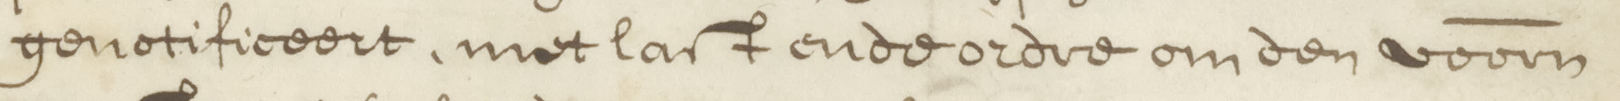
genotificeert, met last ende ordre om den voorn
